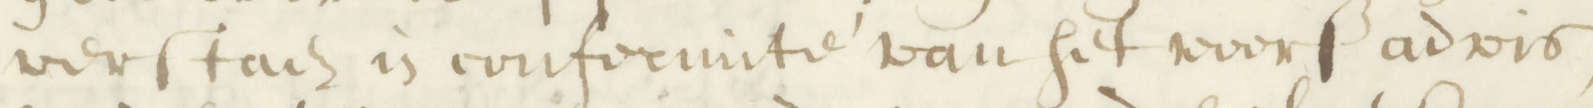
verstaen in conformité van het voors advis
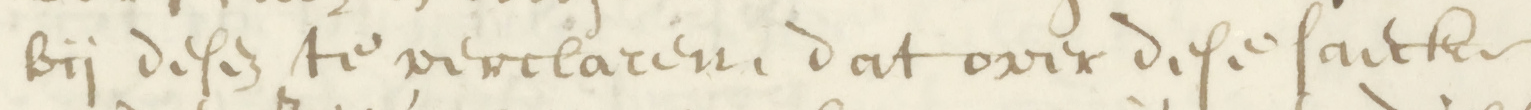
bij desen te verclaren, dat over dese saecke
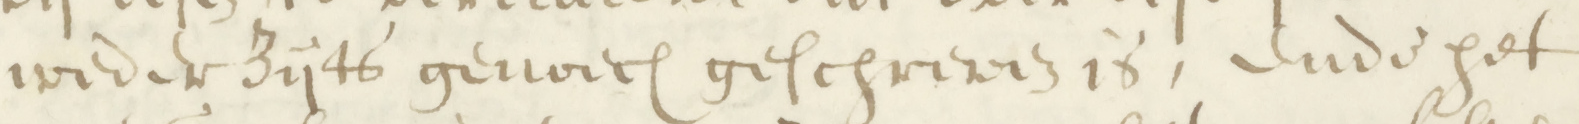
weder Zijts genoech geschreven is, ende het
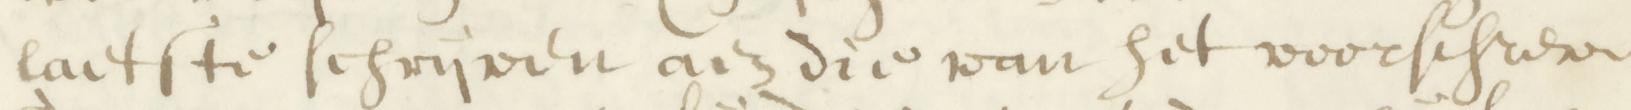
laetste schrijven aen die van het voorschreve
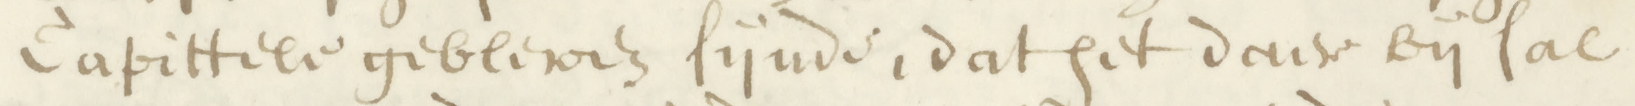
Capittele gebleven sijnde, dat het daer bij sal
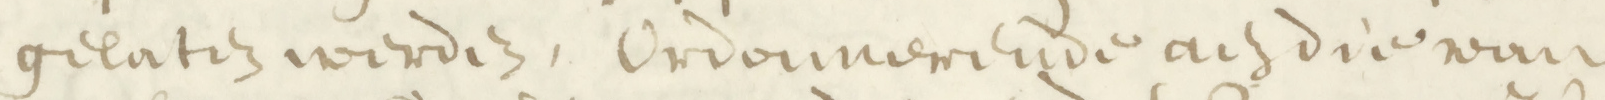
gelaten werden, Ordonnerende aen die van
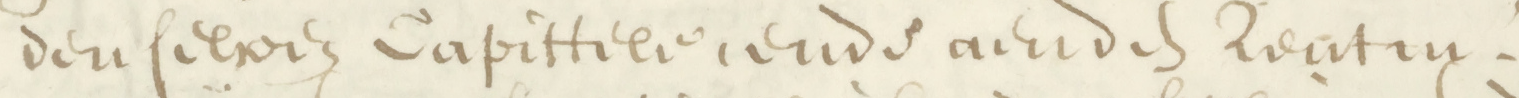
den selven Capittele, ende aenden Rentmr.
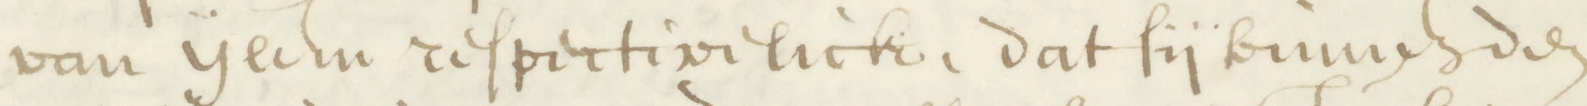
van IJlem respectivelick, dat sij binnen den
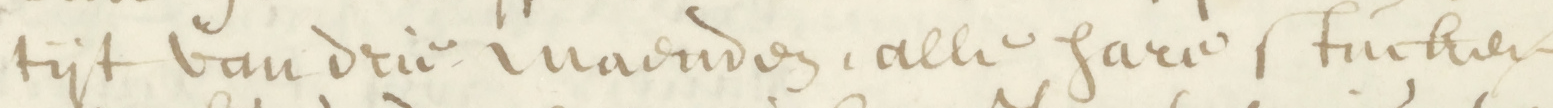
tijt van drie Maenden, alle hare stucken
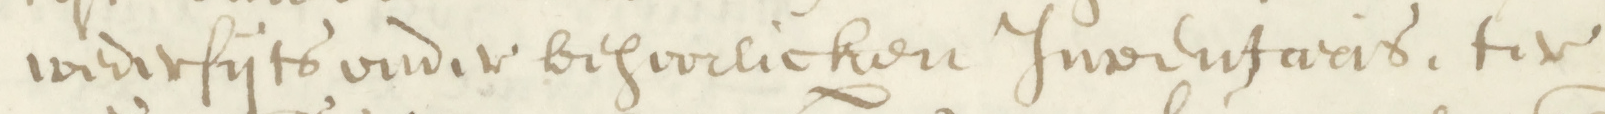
wedersijts onder behoorlicken Inventaris, ter
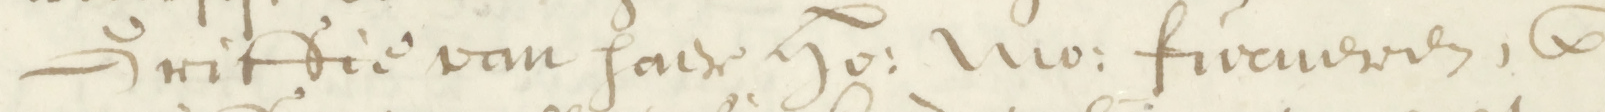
Griffie van haer Ho:Mo: furneren, &
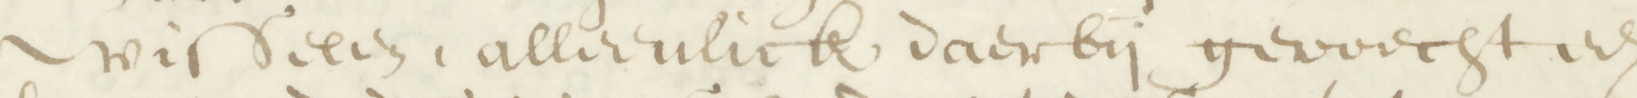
wisselen, alleenlick daerbij gevoecht een
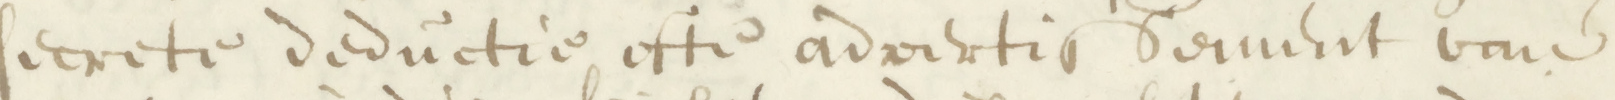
secrete deductie ofte advertissement van
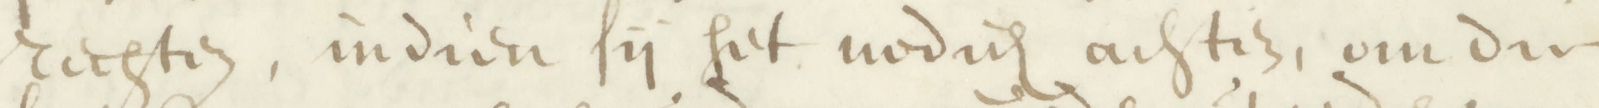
rechten, indien sij het nodich achten, om die
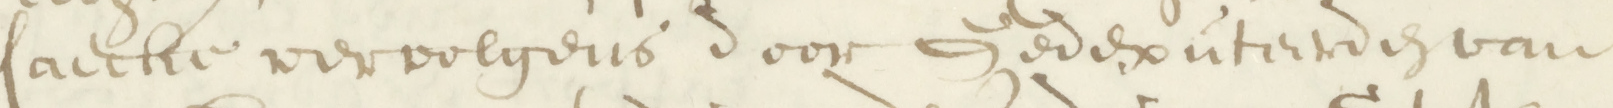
saecke vervolgens door Gedeputeerden van
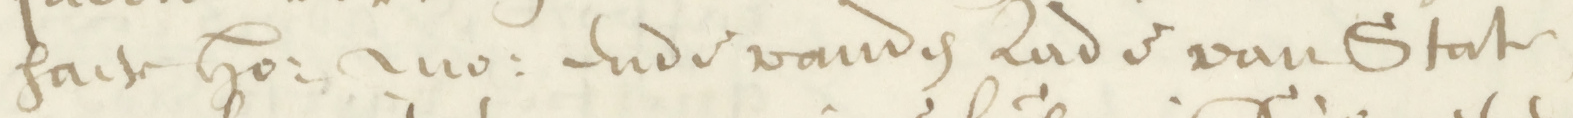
haer Ho:Mo: ende vanden Rade van State,
